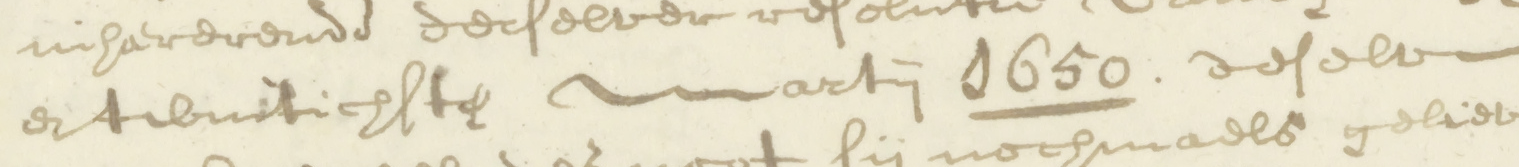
entwintichsten Martij 1650. deselve
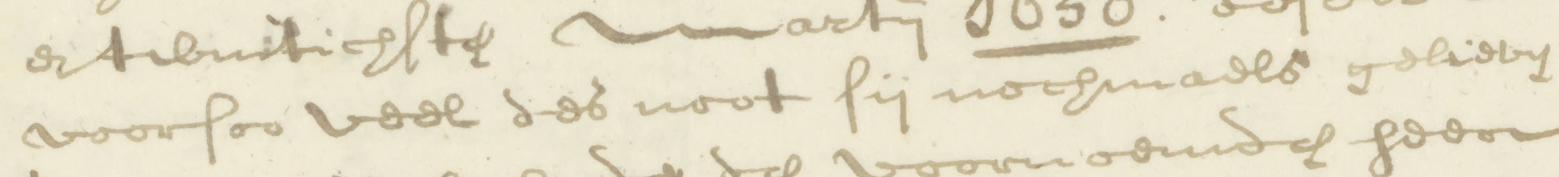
voor soo veel des noot sij nochmaels gelieven
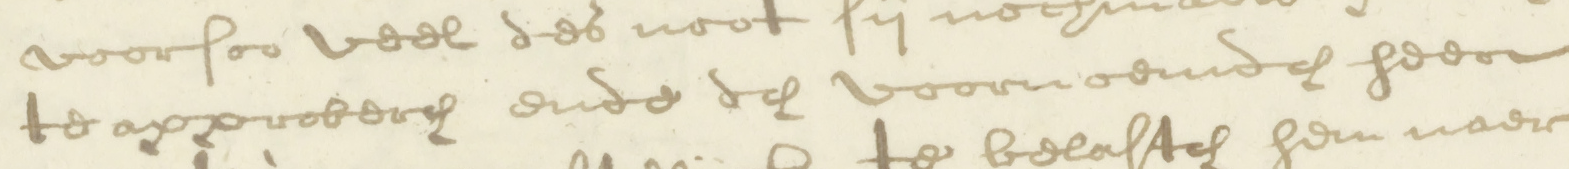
te approberen ende den voornoemden heer
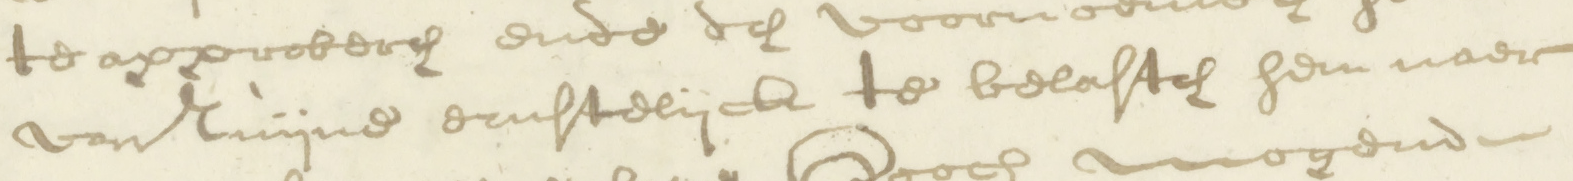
van Ruijne ernstelijck te belasten hem naer
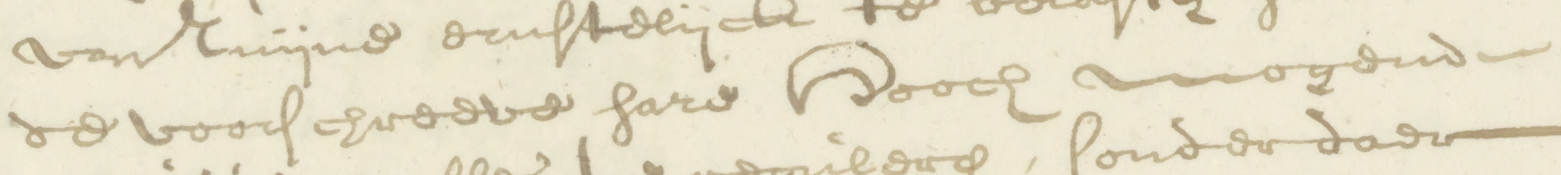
de voorschreeve hare Hooch Mogende
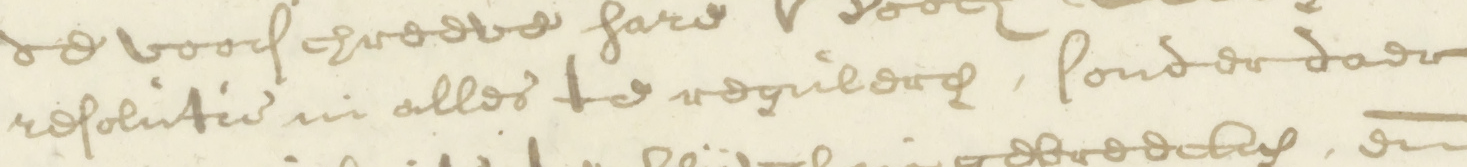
resolutie in alles te reguleren, sonder daer
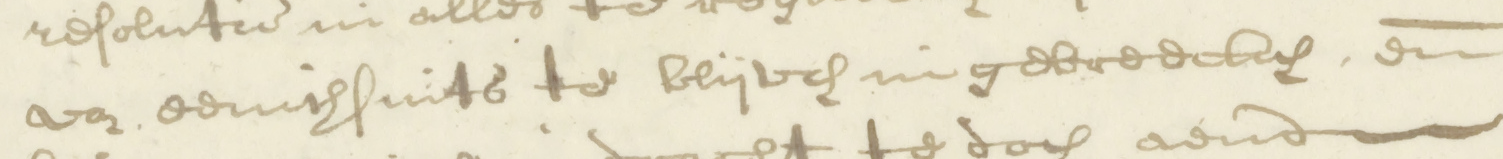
van eenichsints te blijven in gebreecken en
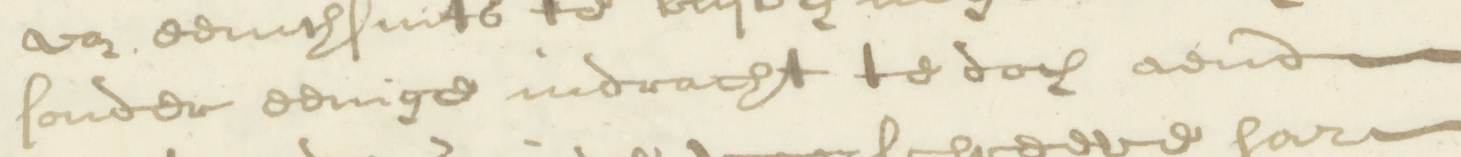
sonder eenige indracht te doen aende
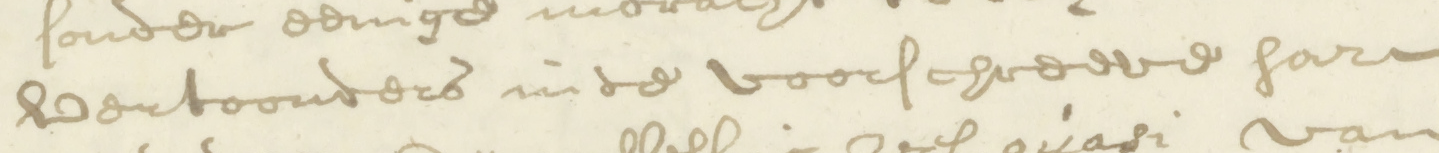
Vertoonders inde voorschreeve hare
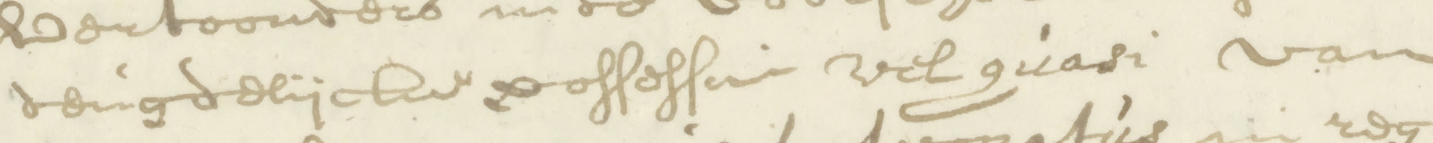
deugdelijcke possessie vel quasi van
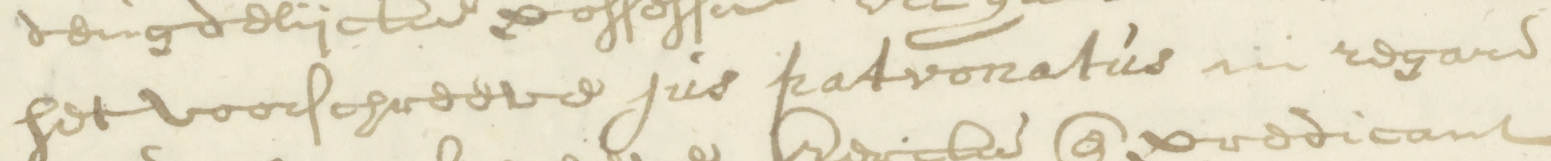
het voorschreeve jus patronatus in regard
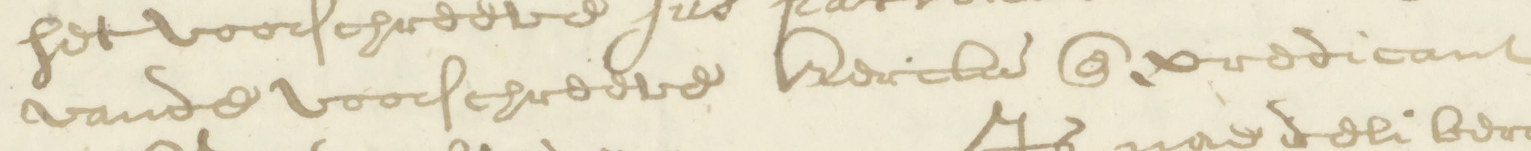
vande voorschreeve kercke & predicant
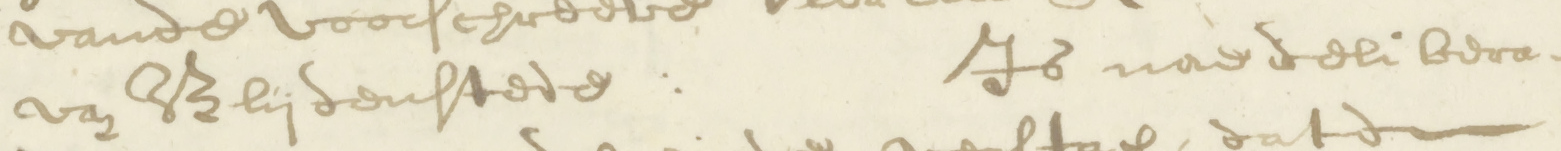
van Blijdenstede: Is nae delibera=
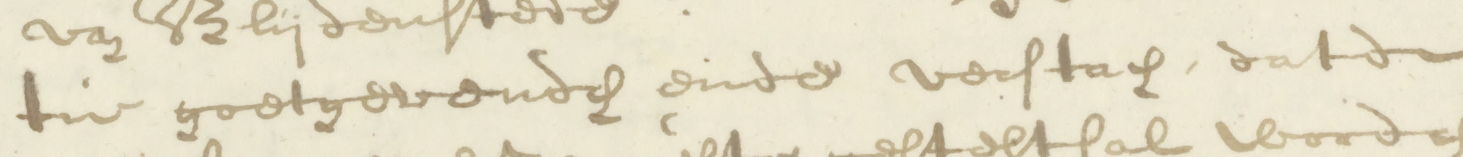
tie goetgevonden ende verstaen, dat de
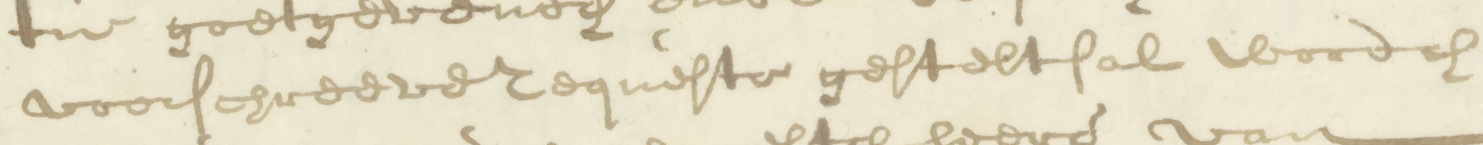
voorschreeve requeste gestelt sal worden
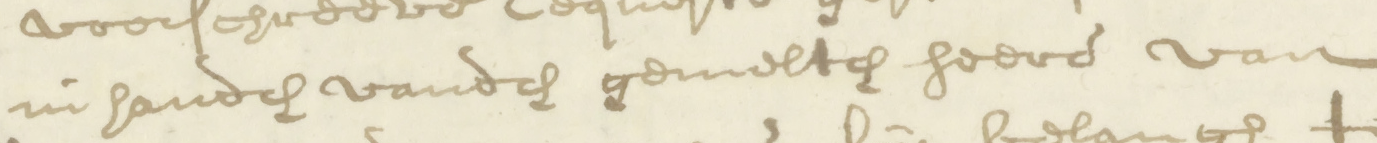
in handen vanden gemelten heere van
